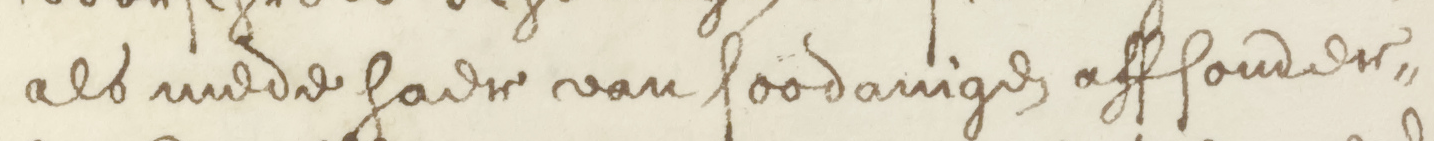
als mede haer van soodanigen affsonder,,
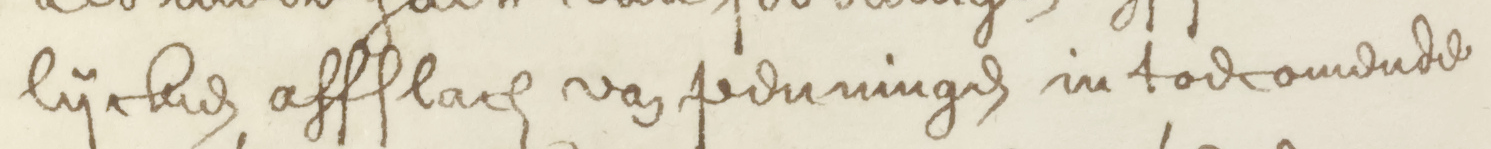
lijcken affslach van penningen in toecomende
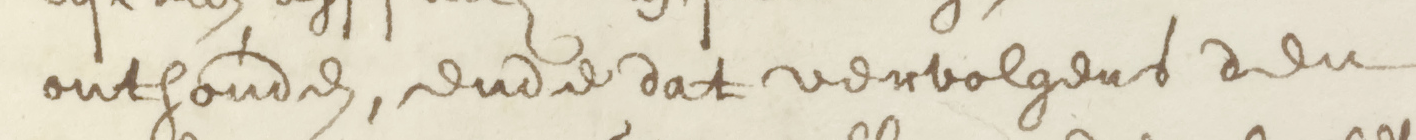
onthouden, ende dat vervolgens den
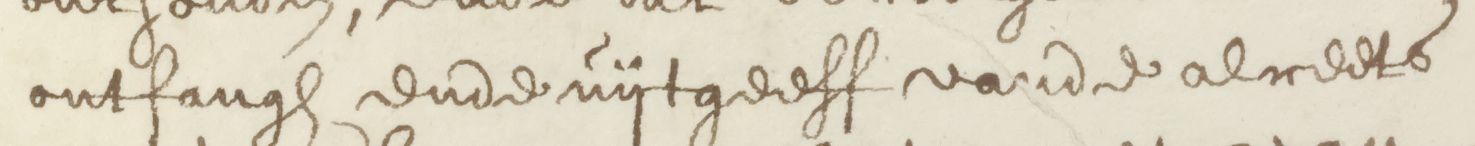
ontfangh ende uijtgeeff vande alreets
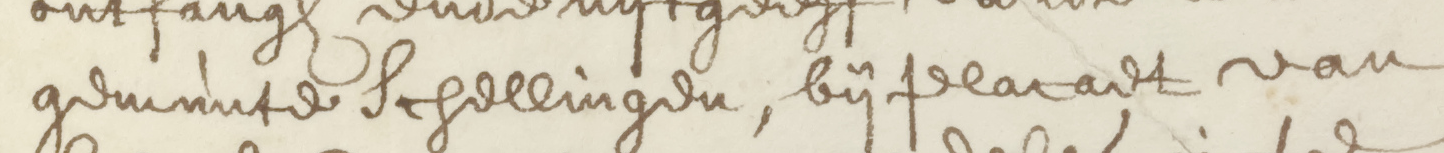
gemunte schellingen, bij placaet van
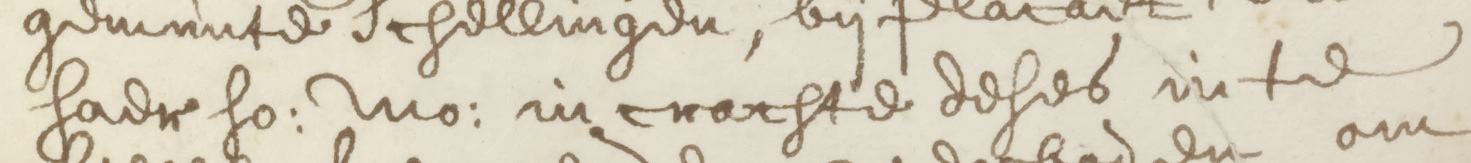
haer Ho:Mo: in crachte deses in te
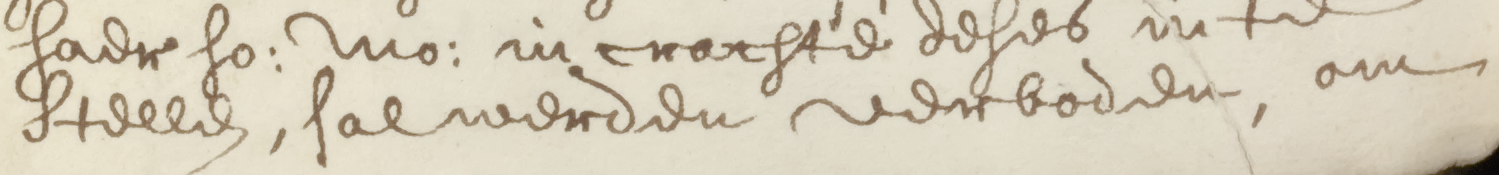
stellen, sal werden verboden, om
